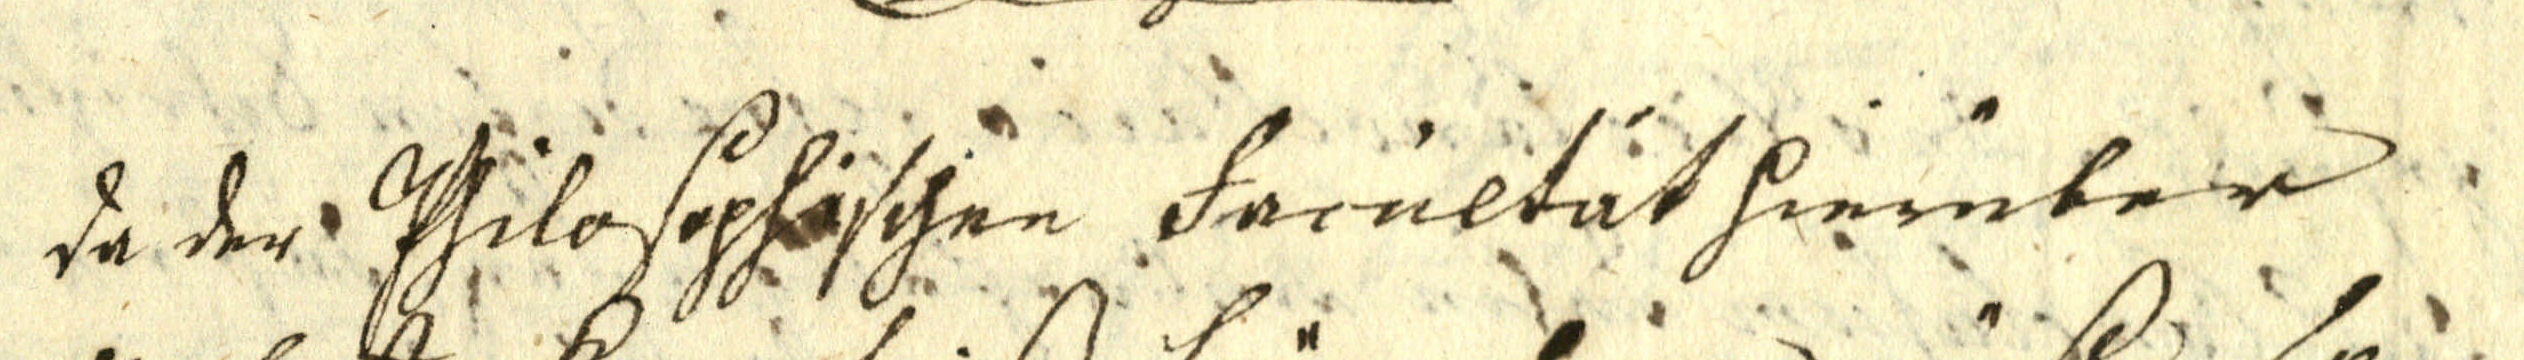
da der Philosophischen Facultät hierüber
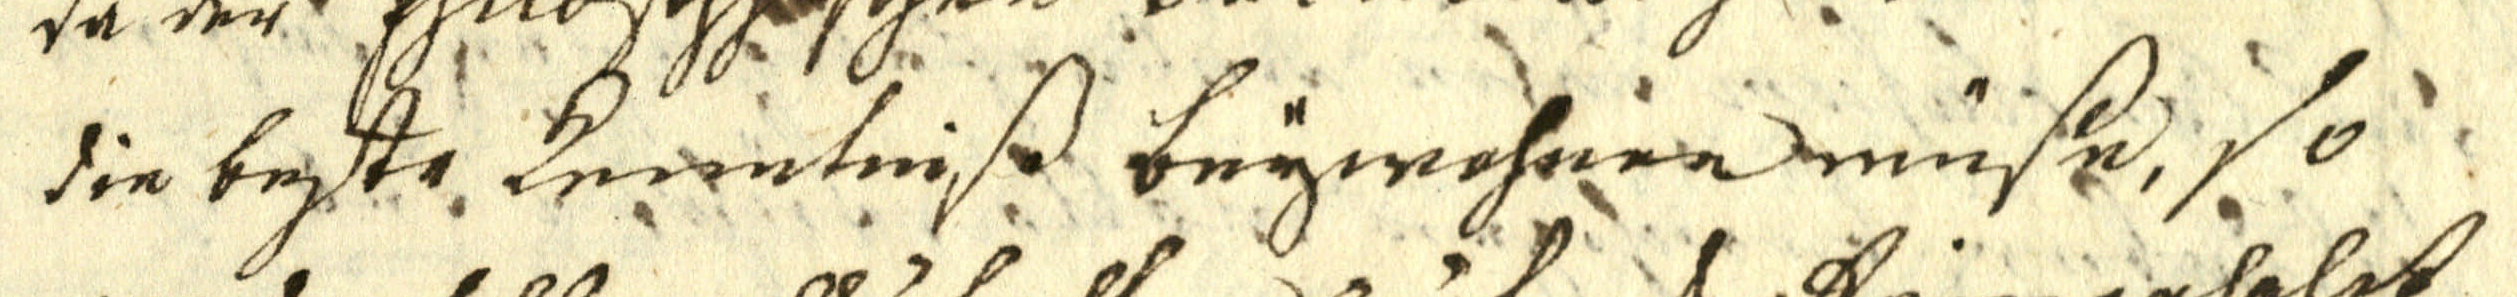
die beste Kenntniß beÿwohnen müße, so
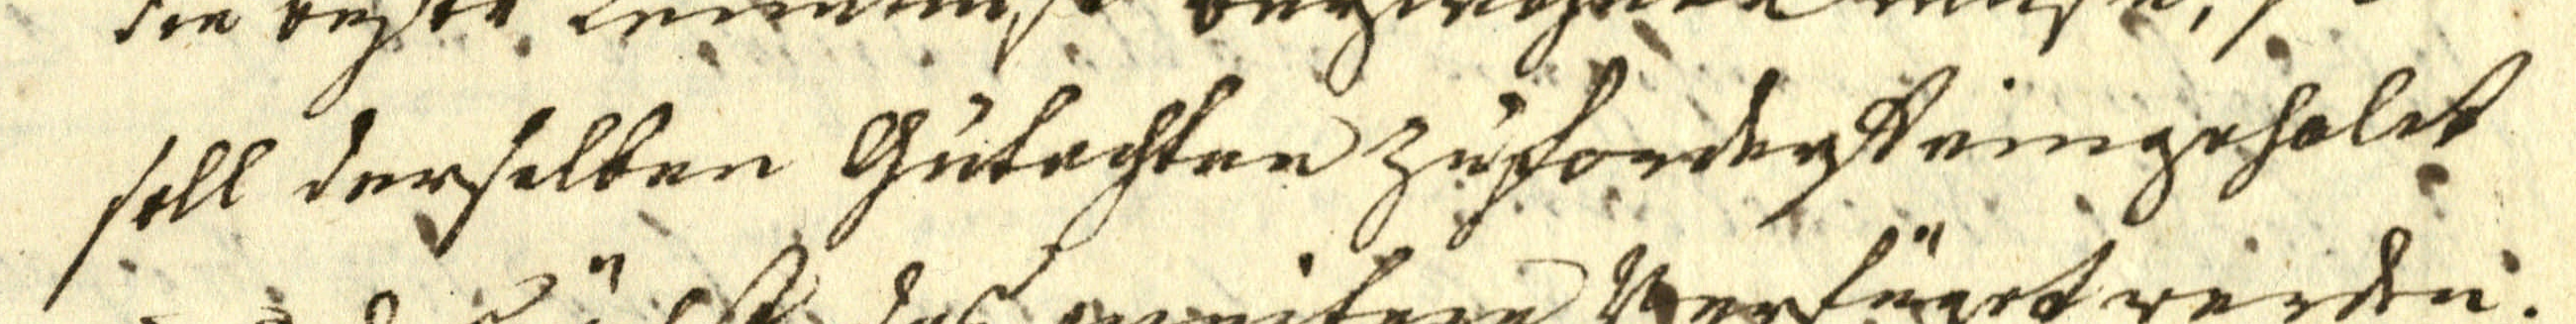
soll derselben Gutachten zuforderst eingeholet
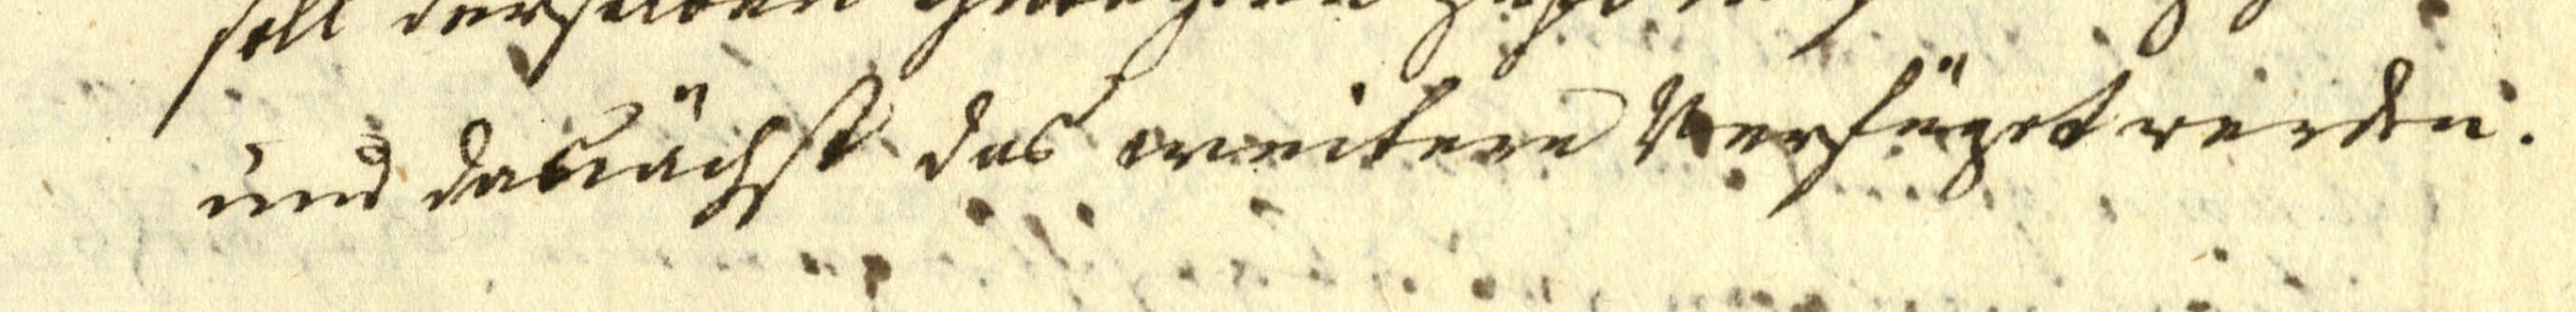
und danächst das weitere verfüget werden.
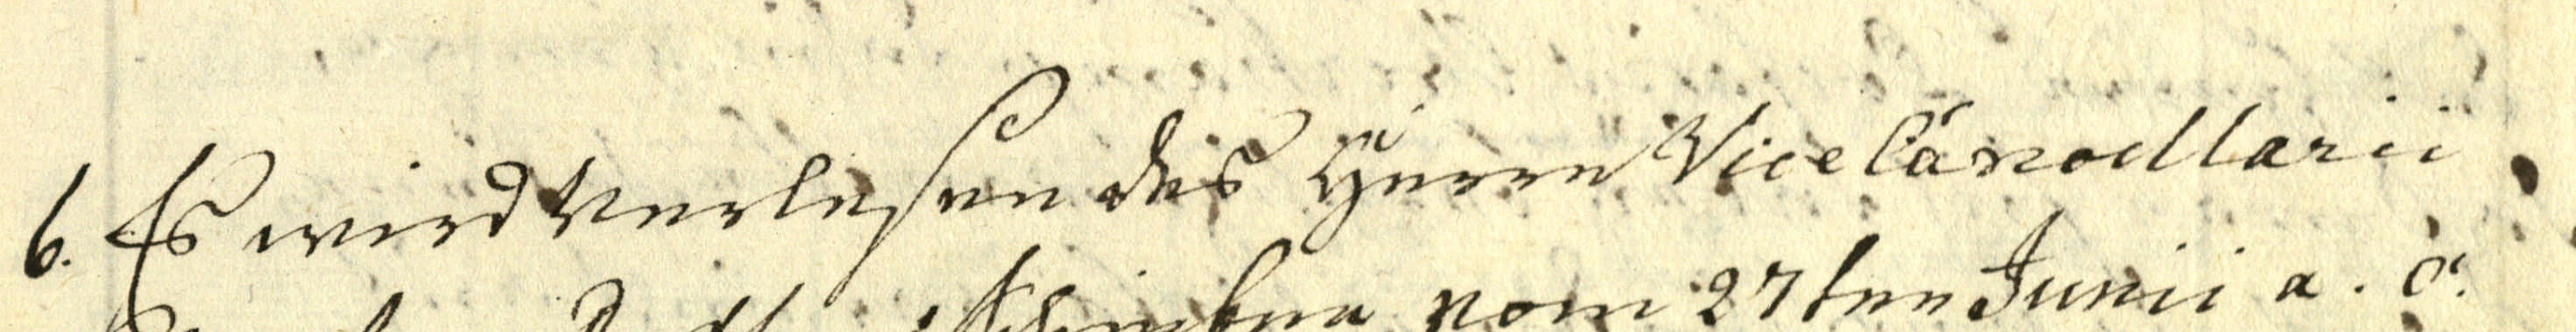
6. Es wird verlesen des Herrn der Cancellarii
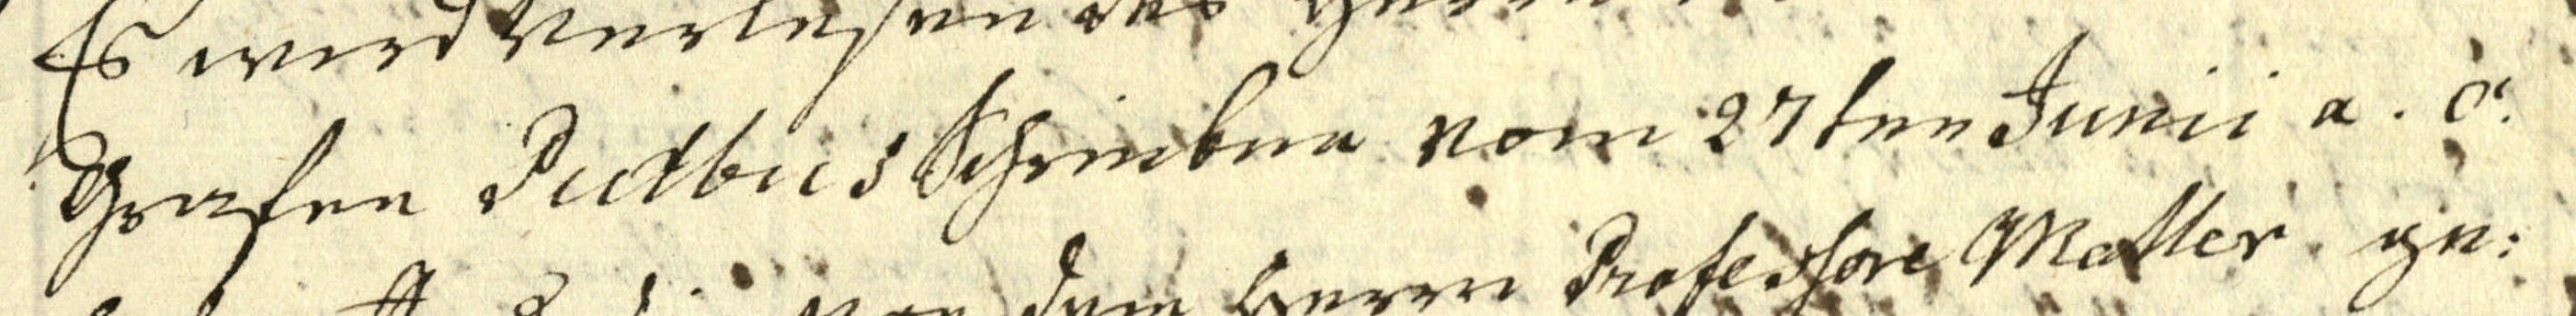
Grafen Putbus Schreiben vom 27ten Junii a.c.
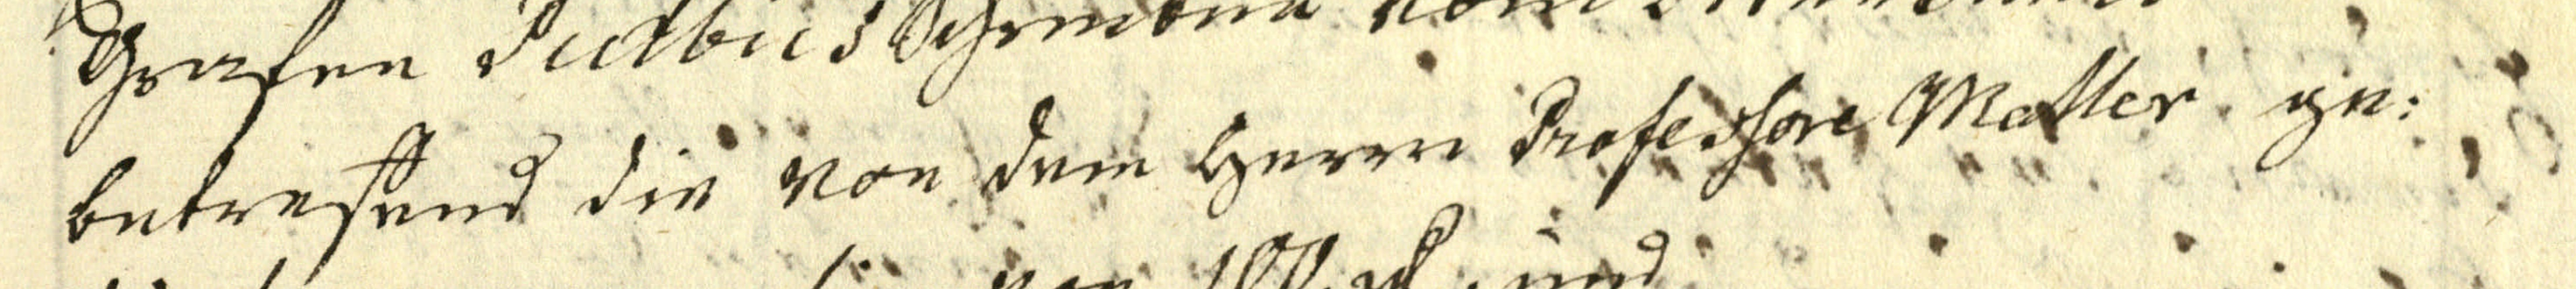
betreffend die von der Herrn Professor Möller ge¬
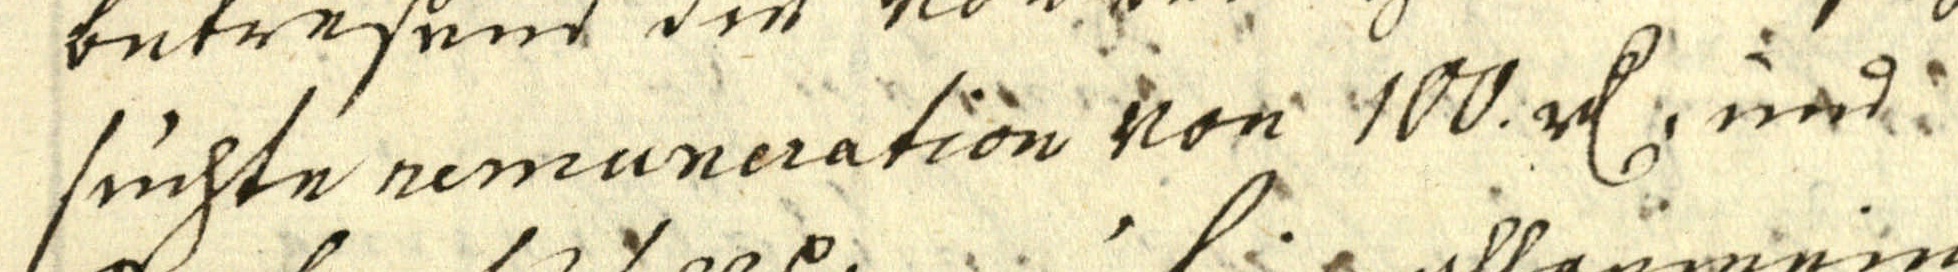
suchte remuneration von 100. rl, und
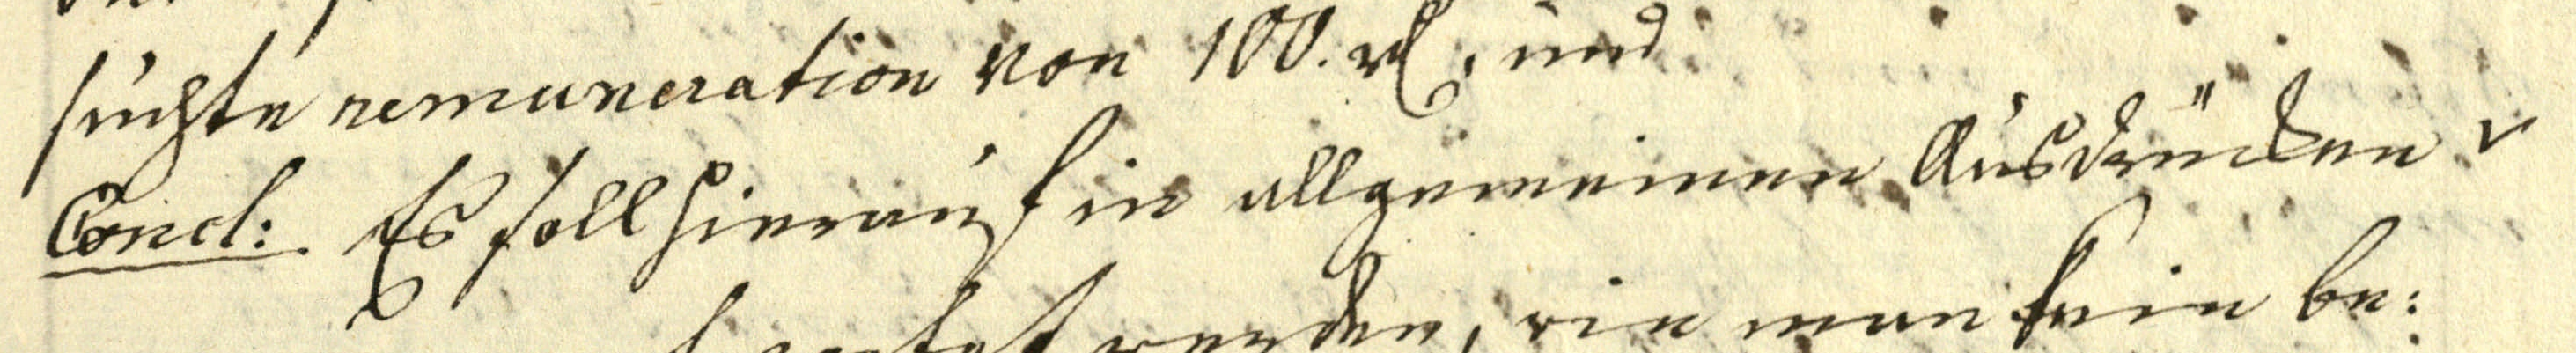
Concl. Es soll hierauf in allgemeinen Ausdrücken
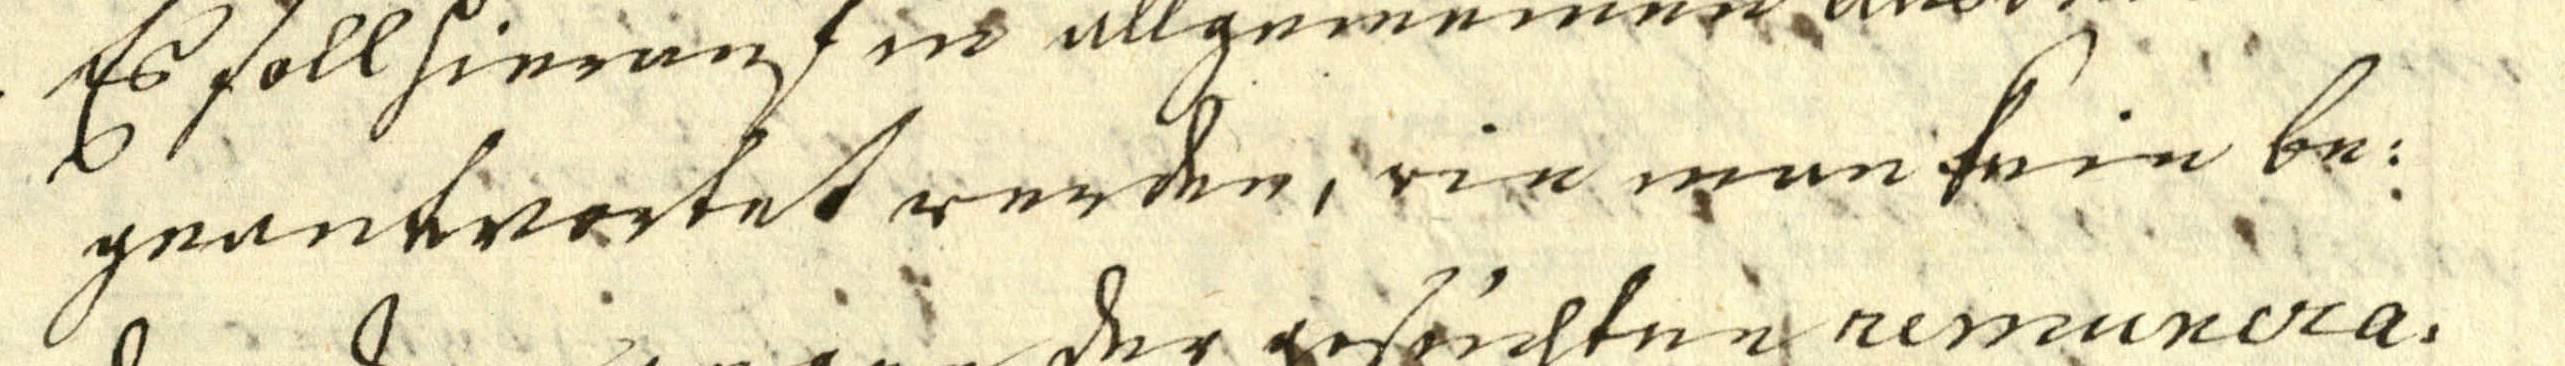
geantwortet werden, wie man kein Be¬
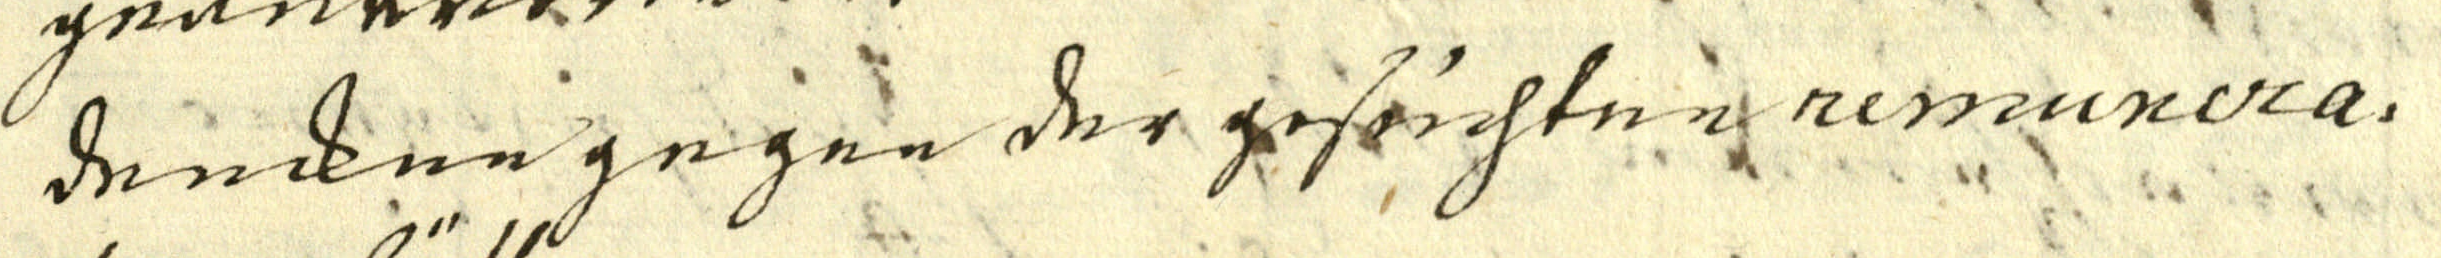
dencken gegen der gesuchten remunera¬
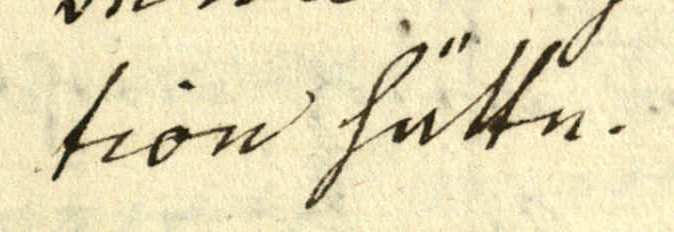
tion hätte.
